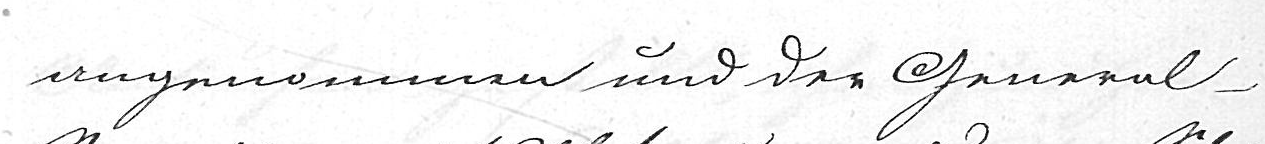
angenommen und der General-
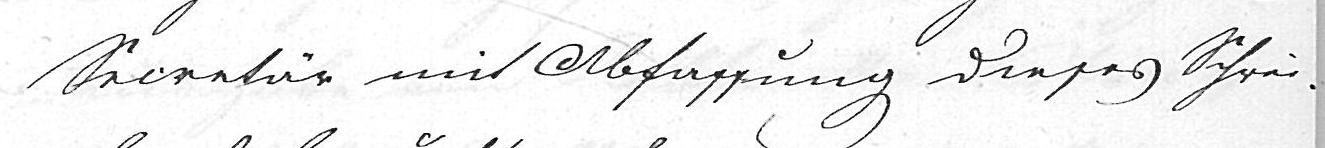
Secretär mit Abfassung dieses Schrei-
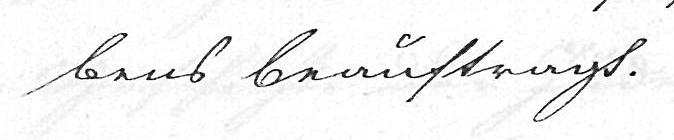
bens beauftragt.
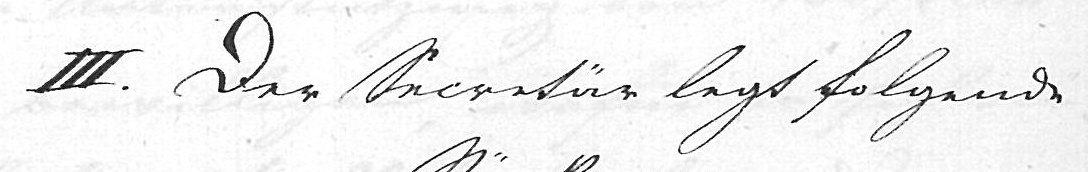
III. Der Secretär legt folgende
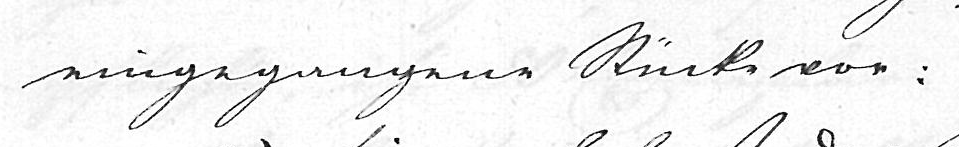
eingegangenen Stücke vor:
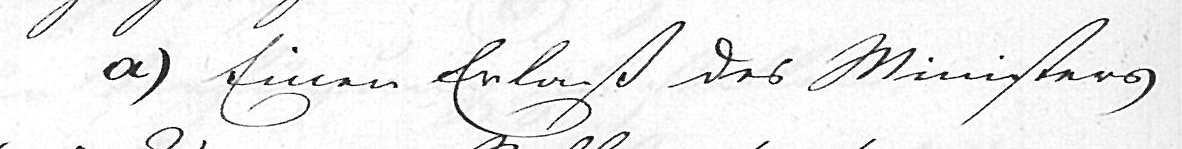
a) Einen Erlaß des Ministers
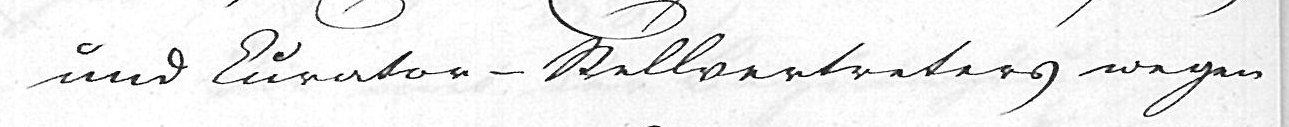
und Curator-Stellvertreters wegen
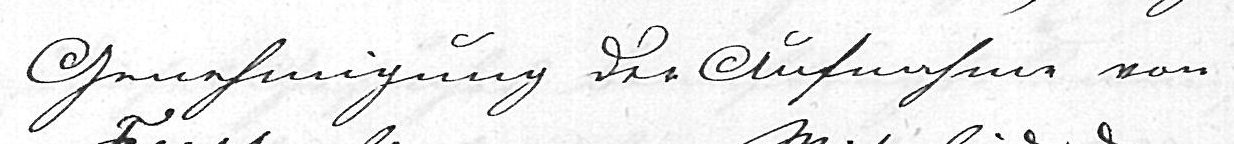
Genehmigung der Aufnahme von
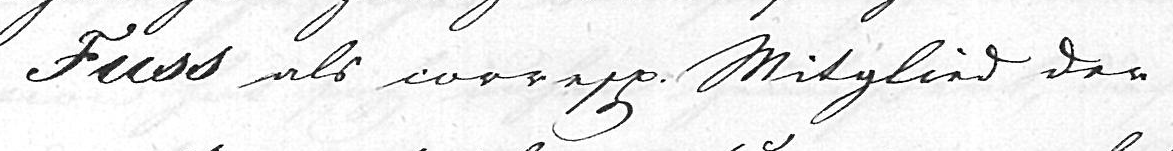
Fuss als corresp. Mitglied der
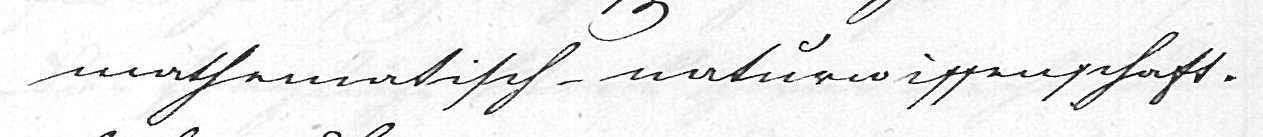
mathematisch-naturwissenschaft-
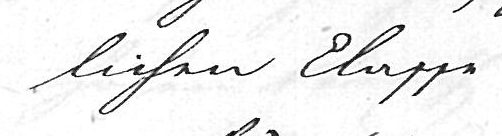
lichen Classe.
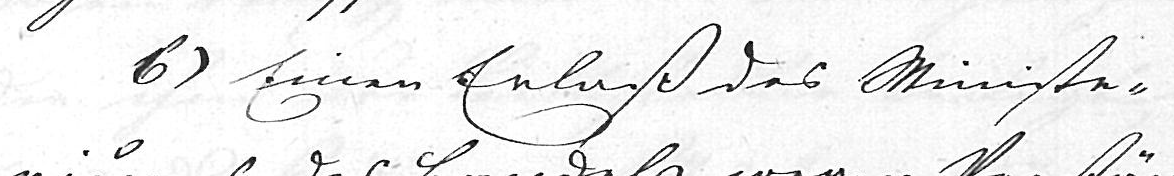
b) Einen Erlaß des Ministe-
